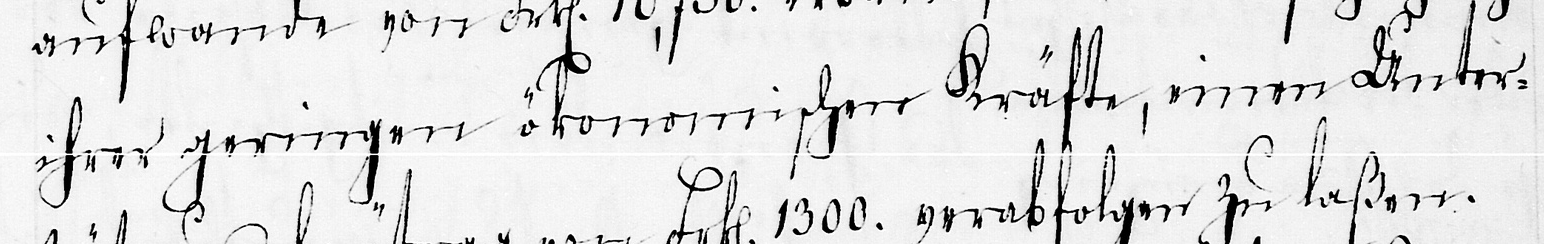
ihrer geringen ökonomischen Kräfte, einen Unter¬
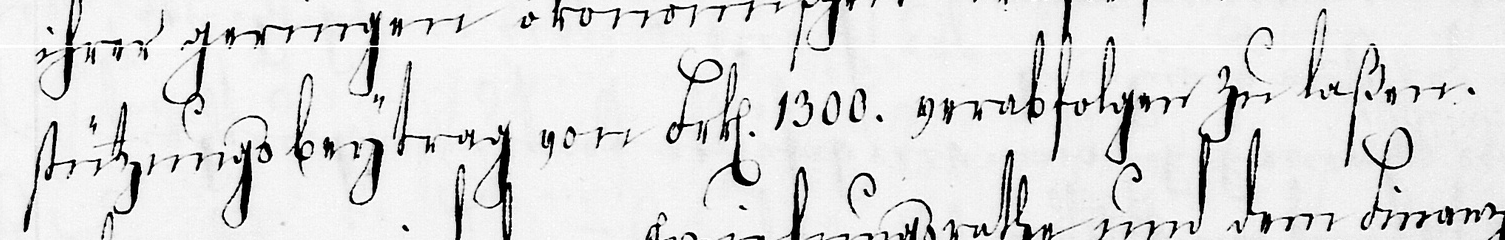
stützungsbeytrag von Frk[en]. 1300. verabfolgen zu laßen.
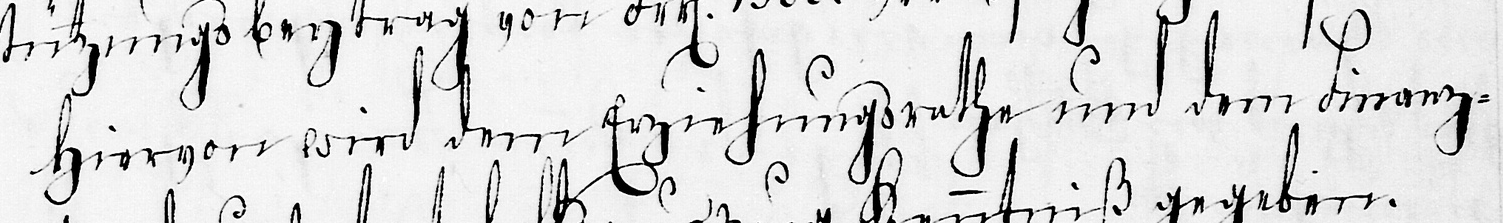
Hiervon wird dem Erziehungsrathe und dem Finanz¬
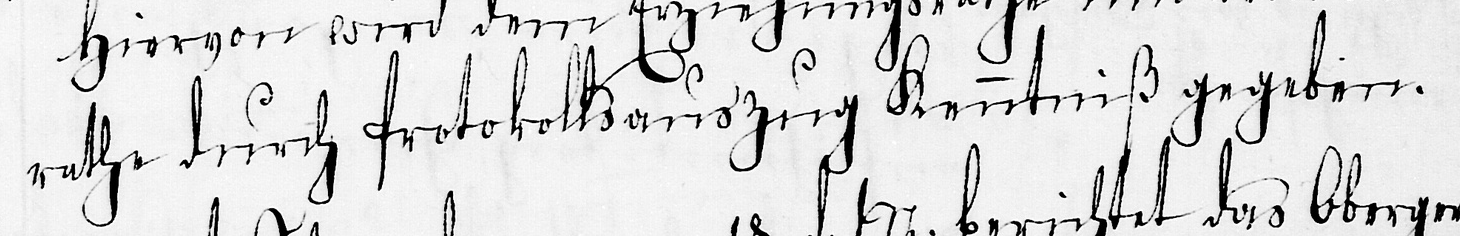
rathe durch Protokollsauszug Kenntniß gegeben.
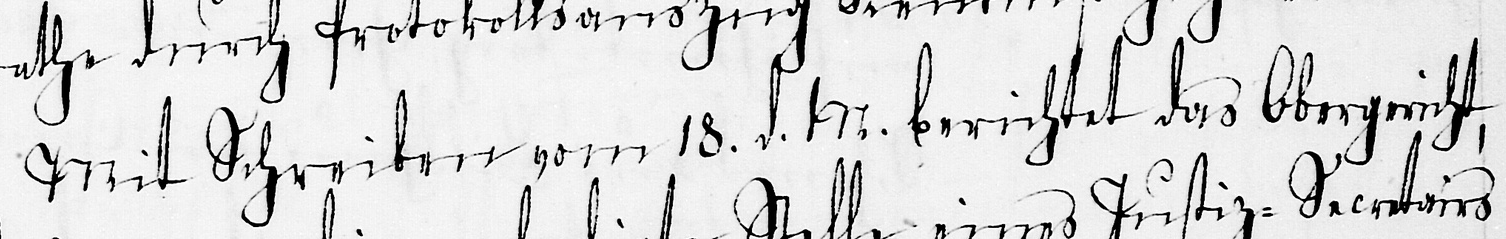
Mit Schreiben vom 18. d. M. berichtet das Obergericht,
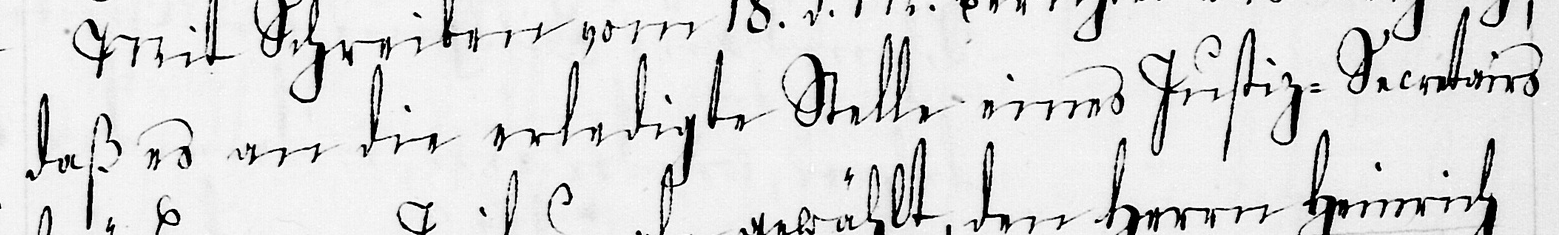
daß es an die erledigte Stelle eines Justiz-Secretairs
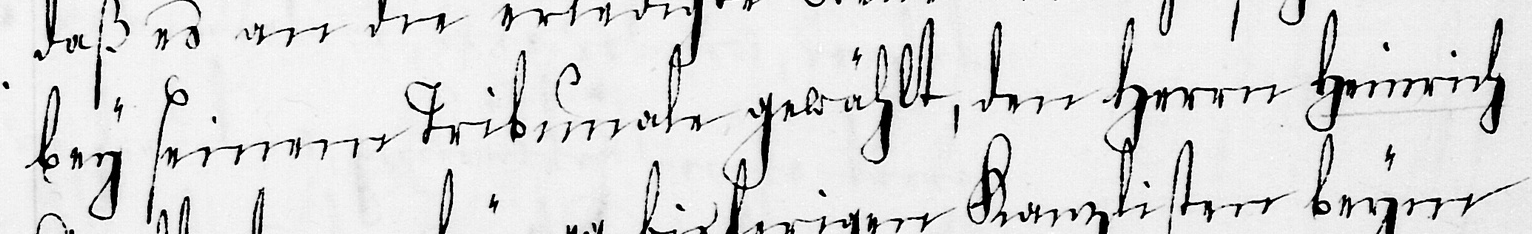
bey seinem Tribunale gewählt, den Herrn Heinrich
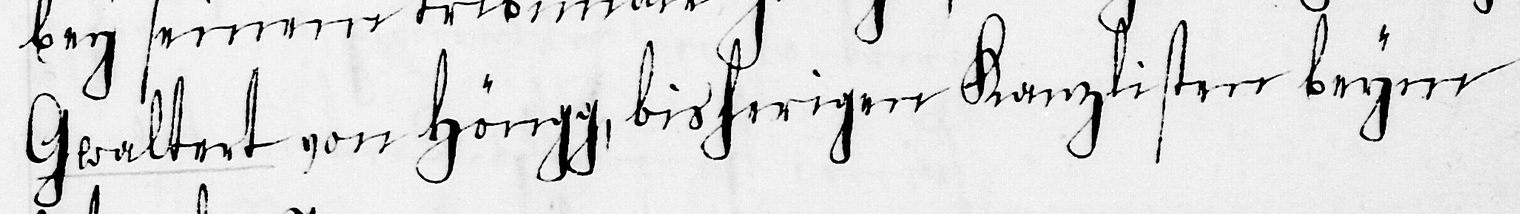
Gwaltert von Höngg, bisherigen Kanzlisten beym
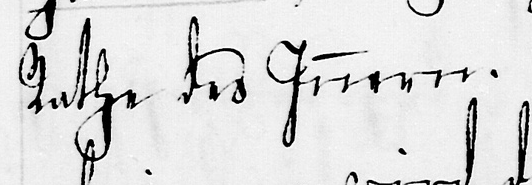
Rathe des Innern.
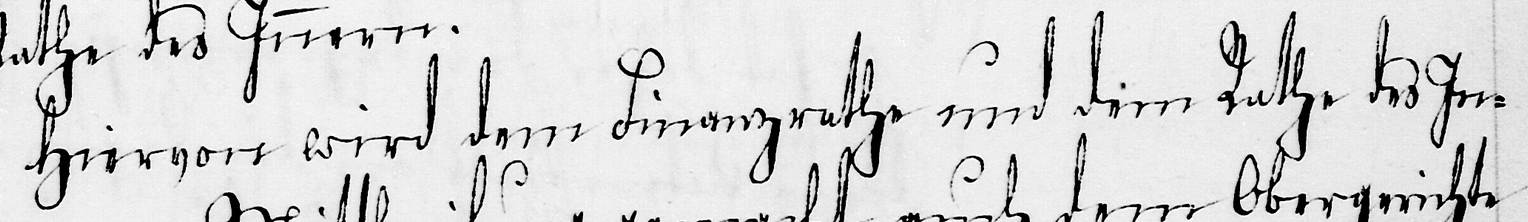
Hiervon wird dem Finanzrathe und dem Rathe des In¬
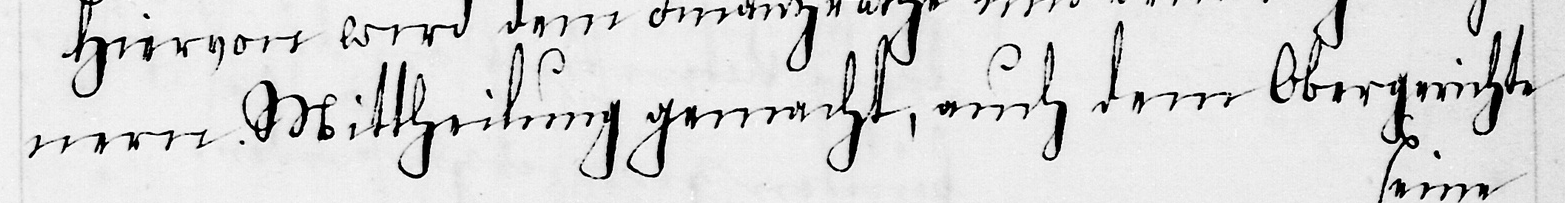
nern Mittheilung gemacht, auch dem Obergerichte
